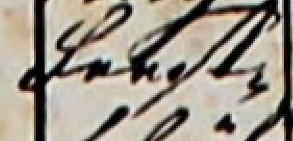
Seest„
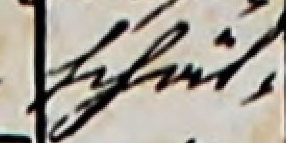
eschät„
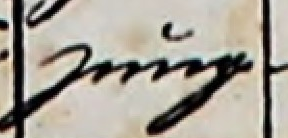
zung
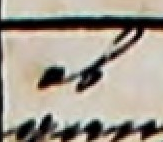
ob
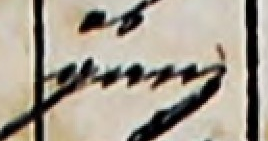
ganz
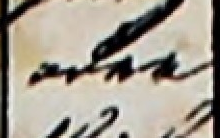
wer
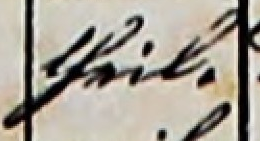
theil.
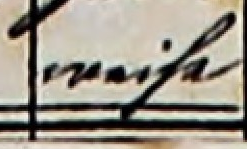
weise
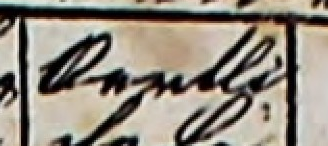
Oertli„
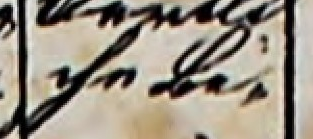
che Ben
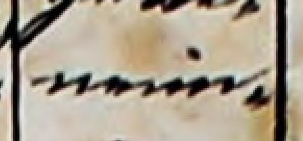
???„
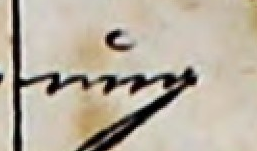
ung
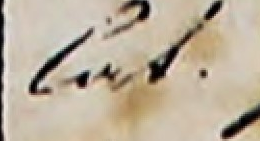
Cat.
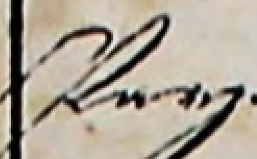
Perg.
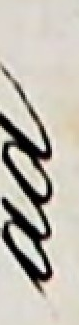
ad
